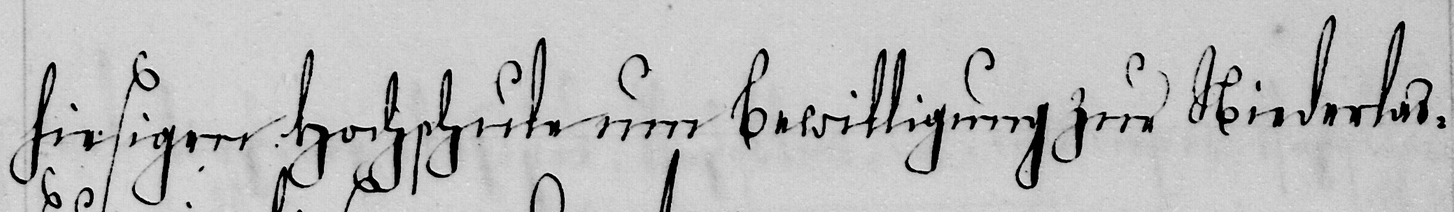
hiesigen Hochschule um Bewilligung zur Niederla¬
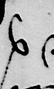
der
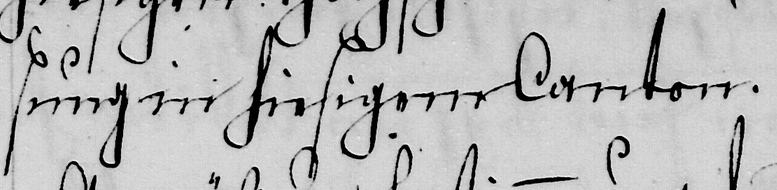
ßung in hiesigem Canton.
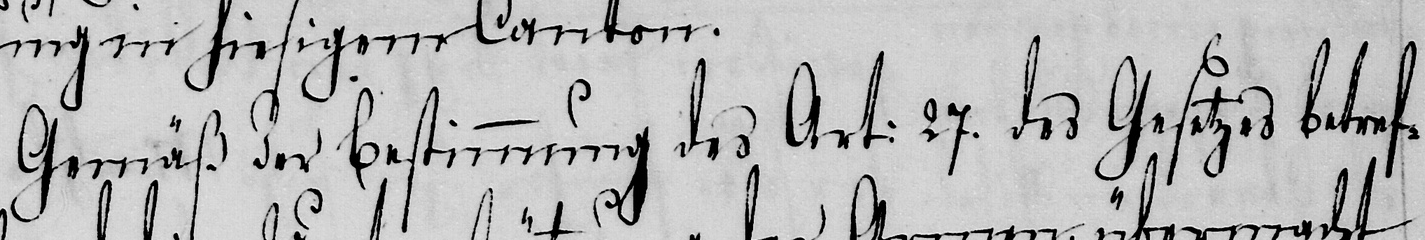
Gemäß der Bestimmung des Art: 27. des Gesetzes betr¬
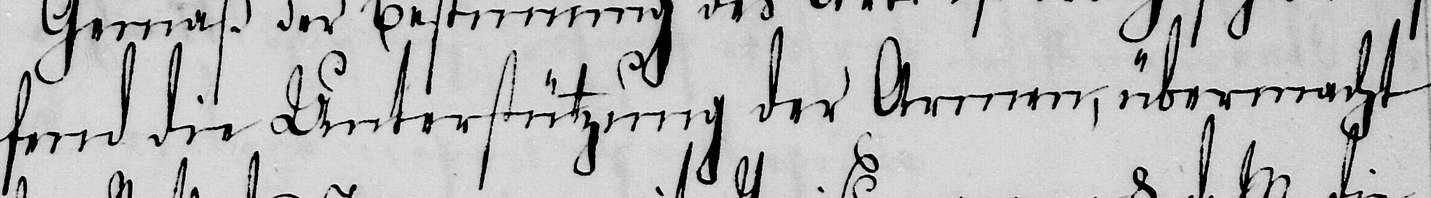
fend die Unterstützung der Armen, übermacht
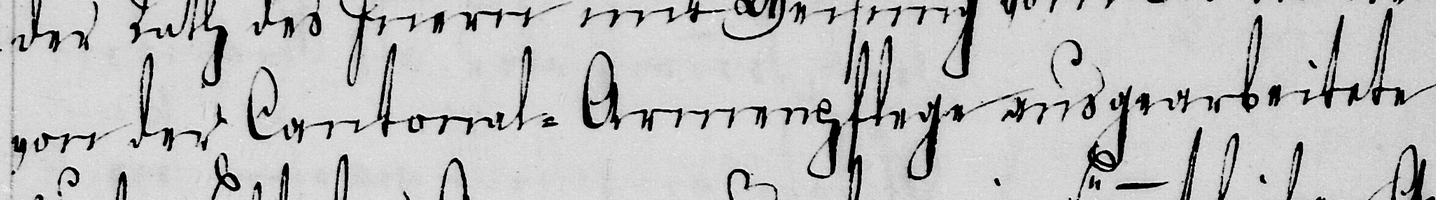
von der Cantonal-Armenpflege ausgearbeitete
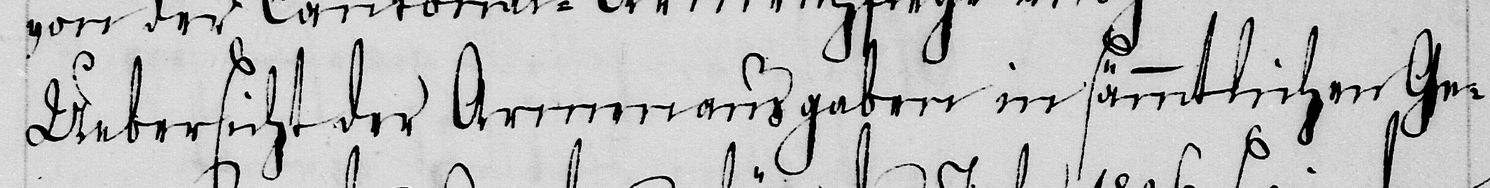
Uebersicht der Armenausgaben in sämmtlichen Ge¬
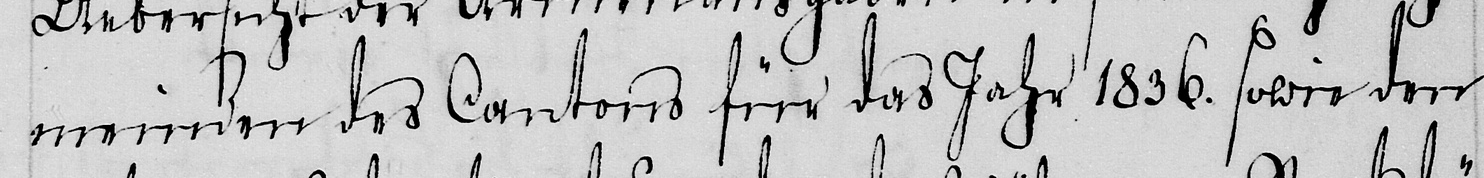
meinden des Cantons für das Jahr 1836. sowie den
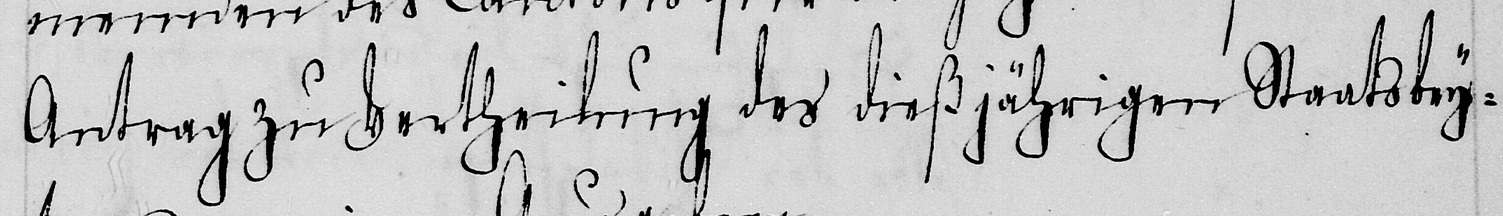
Antrag zu Vertheilung des dießjährigen Staatsbey¬
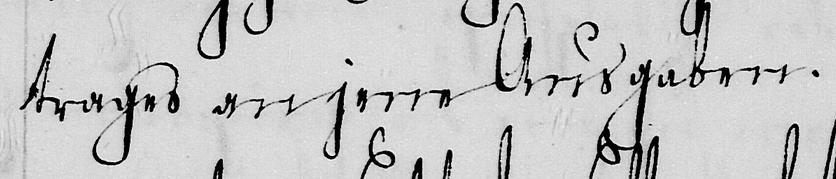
trages an jene Ausgaben.
